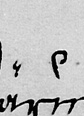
h.
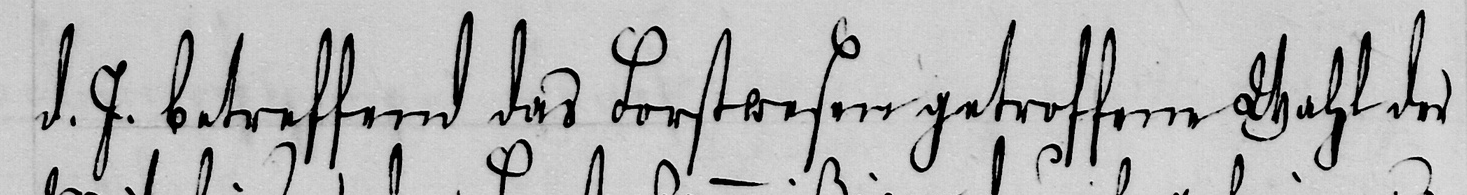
J. betreffend das Forstwesen getroffene Wahl d¬
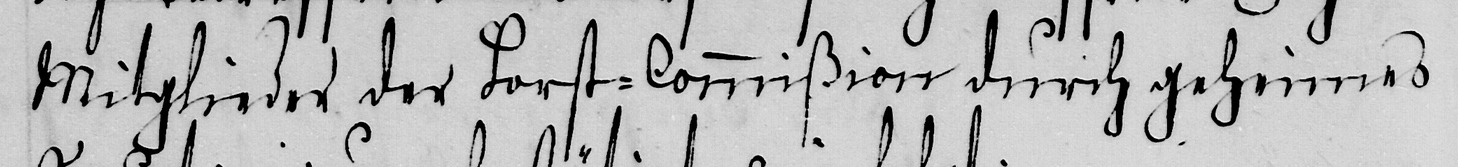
Mitglieder der Forst-Commißion durch geheimes
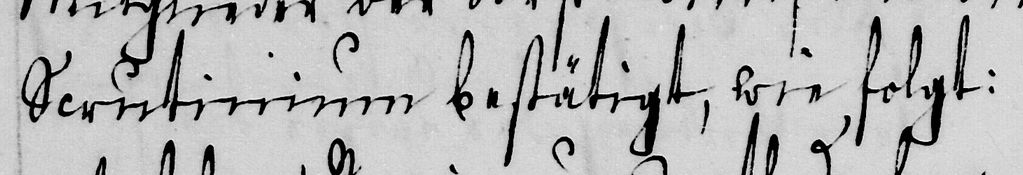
Scrutinium bestätigt, wie folgt:
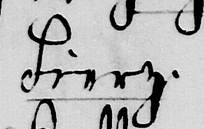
Fierz.
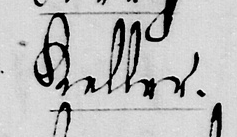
Keller.
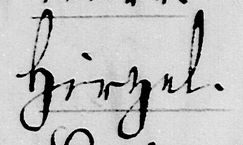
Hirzel.
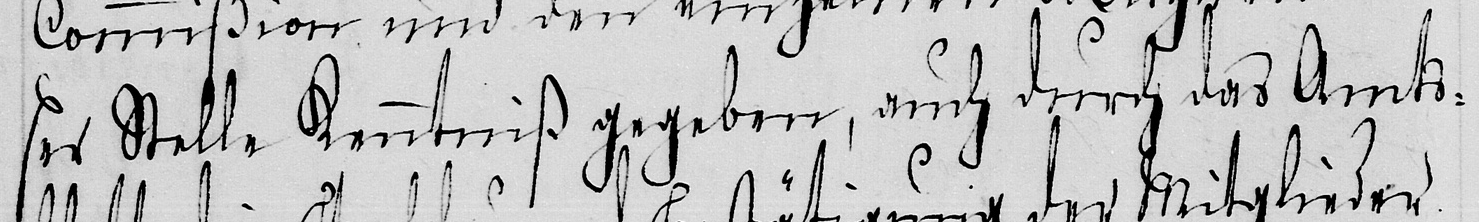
ser Stelle Kenntniß gegeben, auch durch das Amts¬
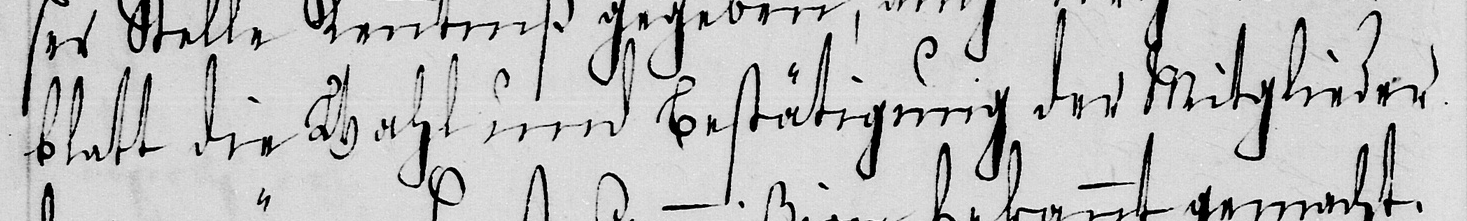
blatt die Wahl und Bestätigung der Mitglieder
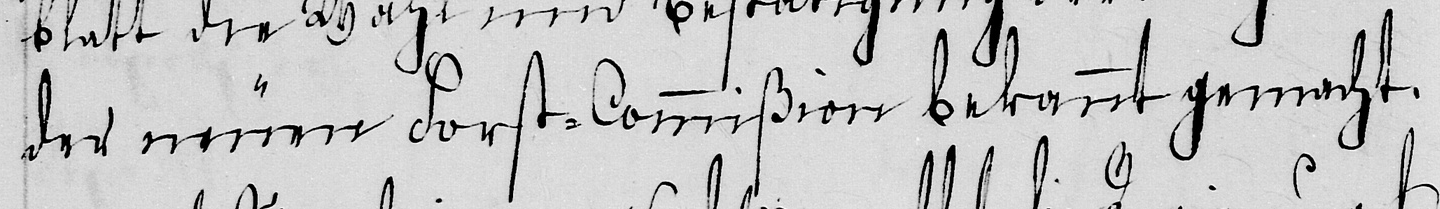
der neuen Forst-Commißion bekannt gemacht.
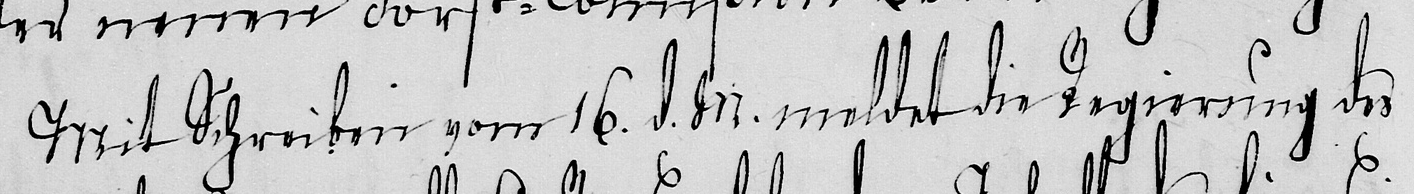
Mit Schreiben vom 16. d. M. meldet die Regierung des
